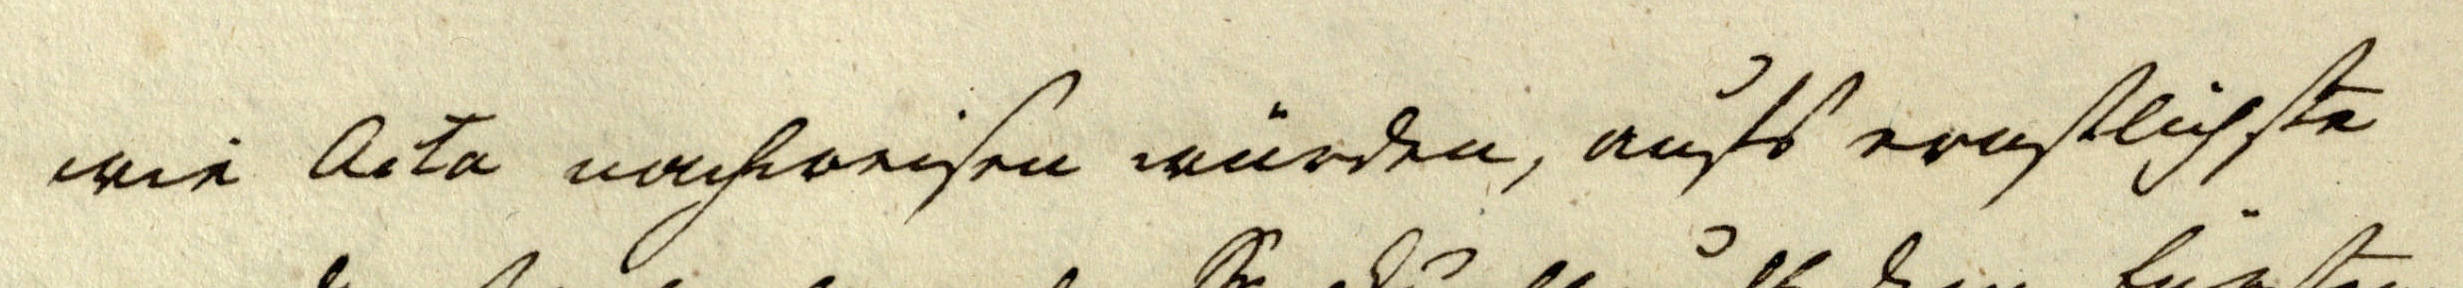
wie Acta nachweisen würden, aufs ernstlichste
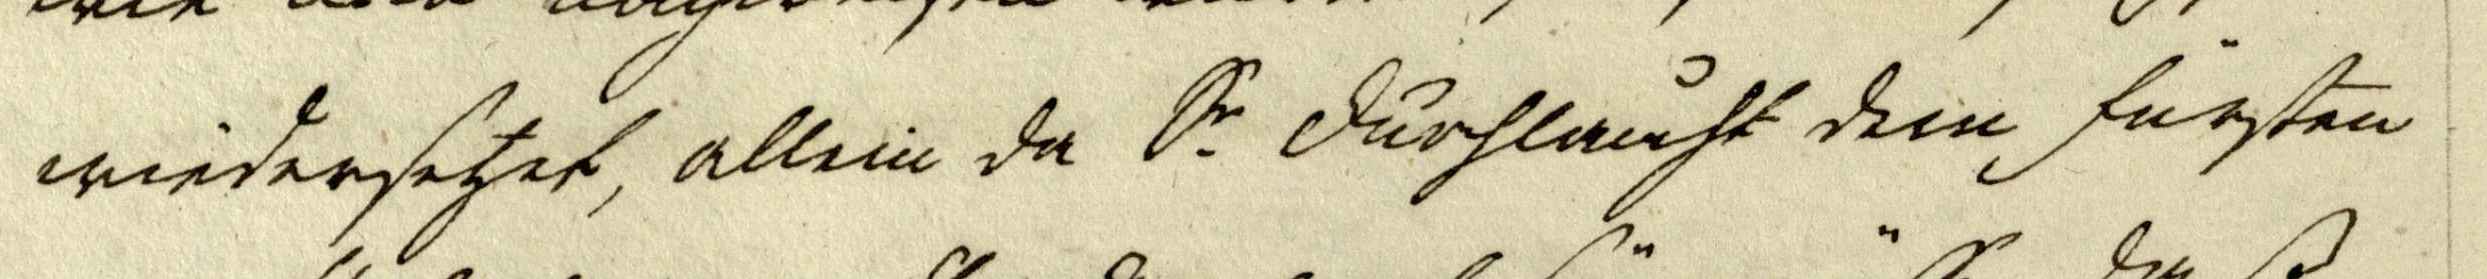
wiedersetzet, allein da Sr Durchlaucht dem Fürsten
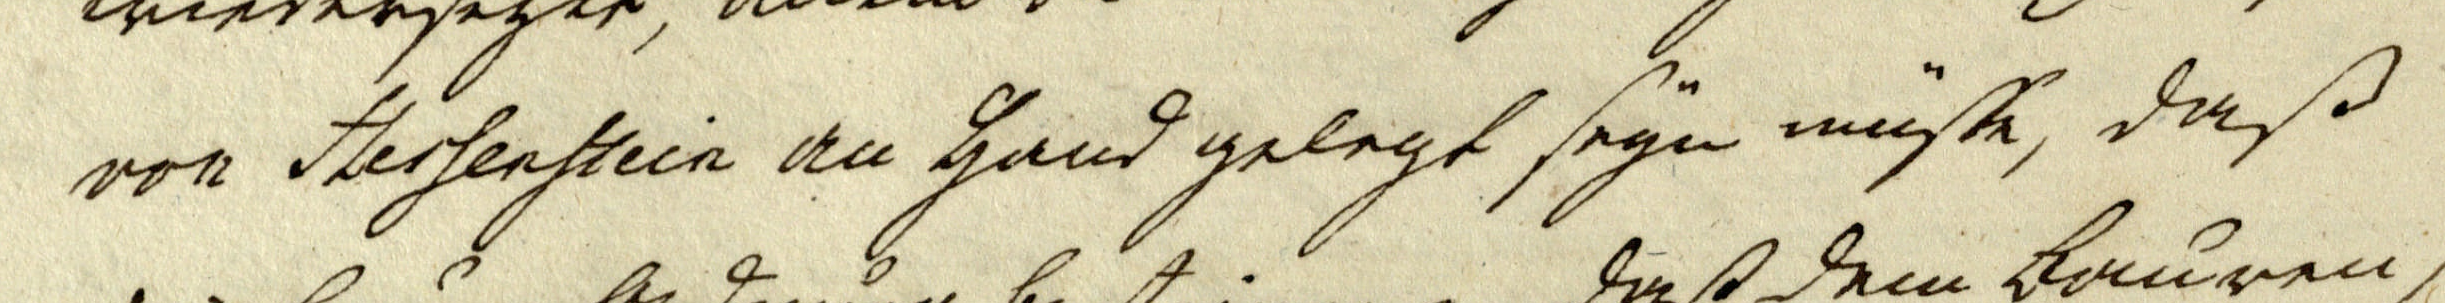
von Hessenstein an Hand gelegt seÿn müsse, daß
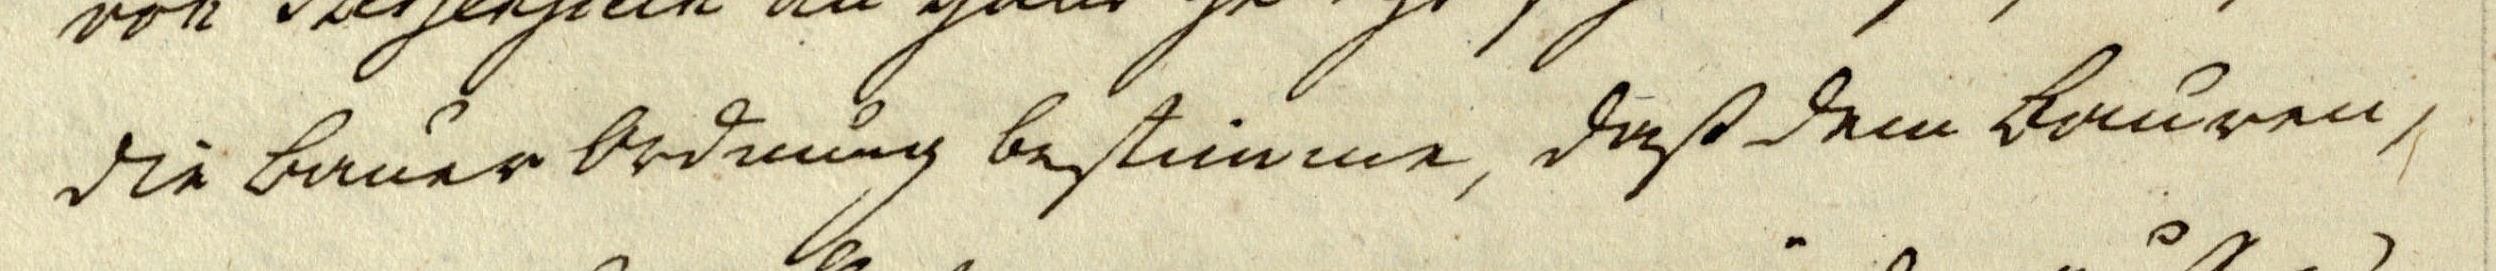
die Bauer Ordnung bestimme, daß dem Bauren,
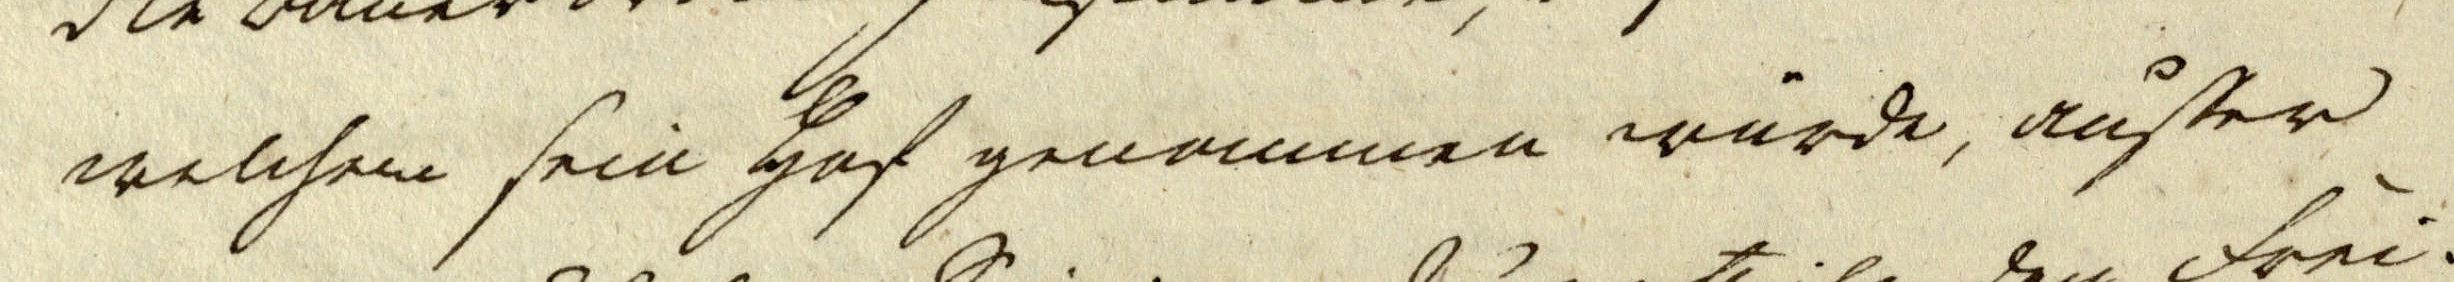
welchem sein Hof genommen würde, ausser
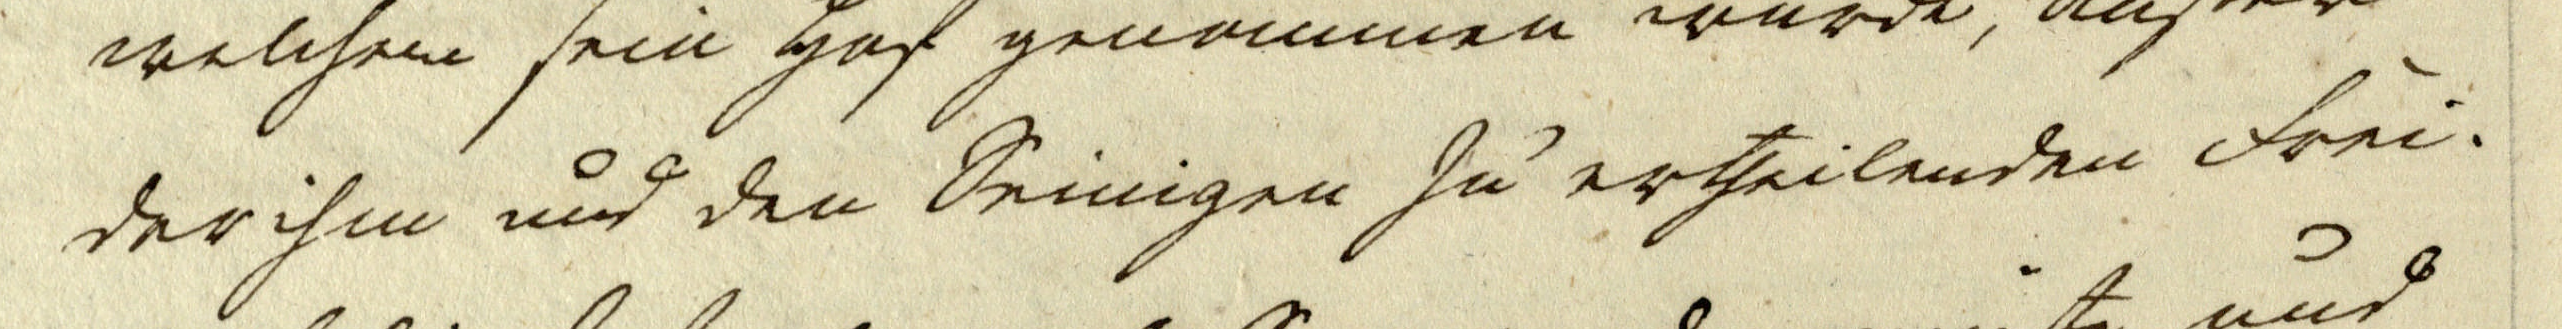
der ihm und den Seinigen zu ertheilenden Frei¬
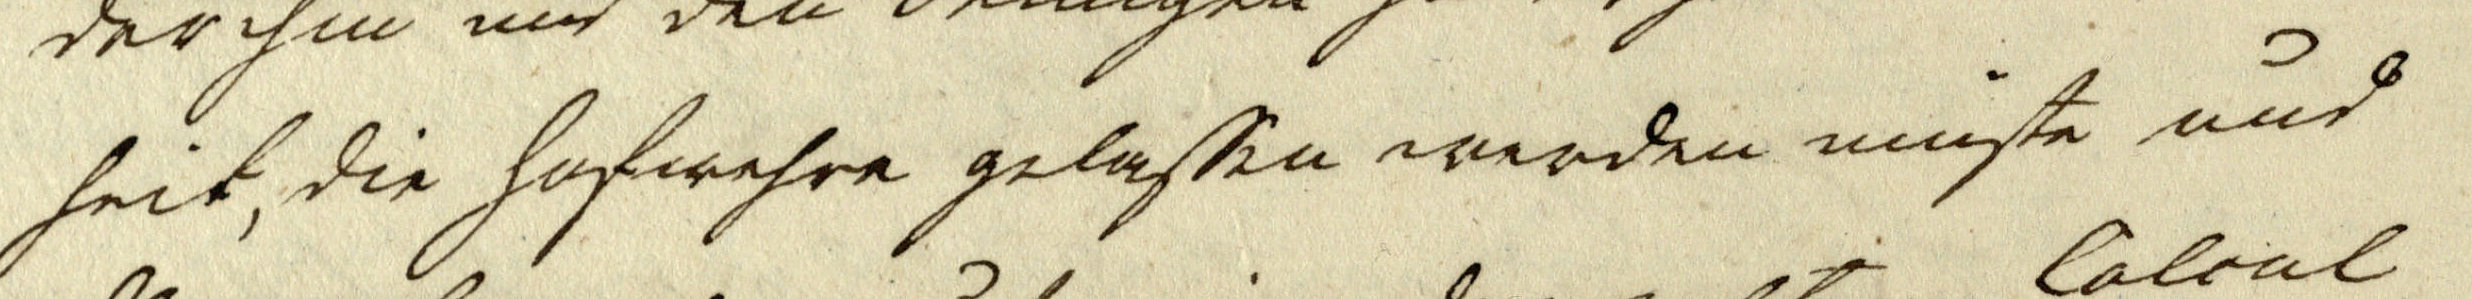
heit, die Hofwehre gelassen werden müßte und
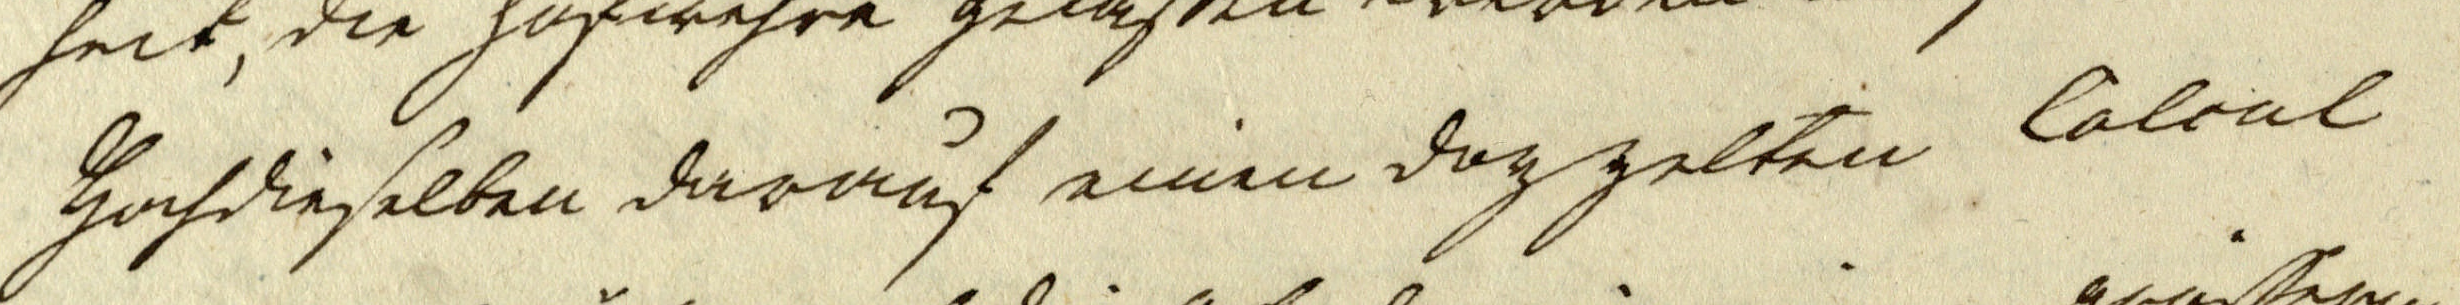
Hochdieselben darauf einen doppelten Calcul
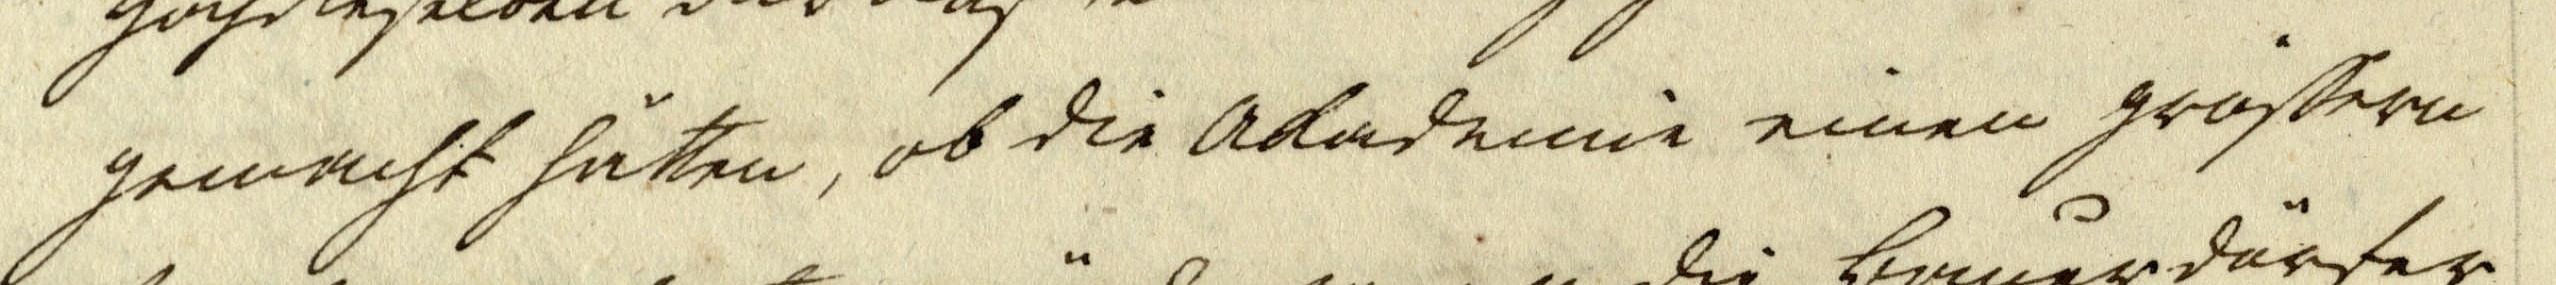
gemacht hätten, ob die Akademie einen grössern
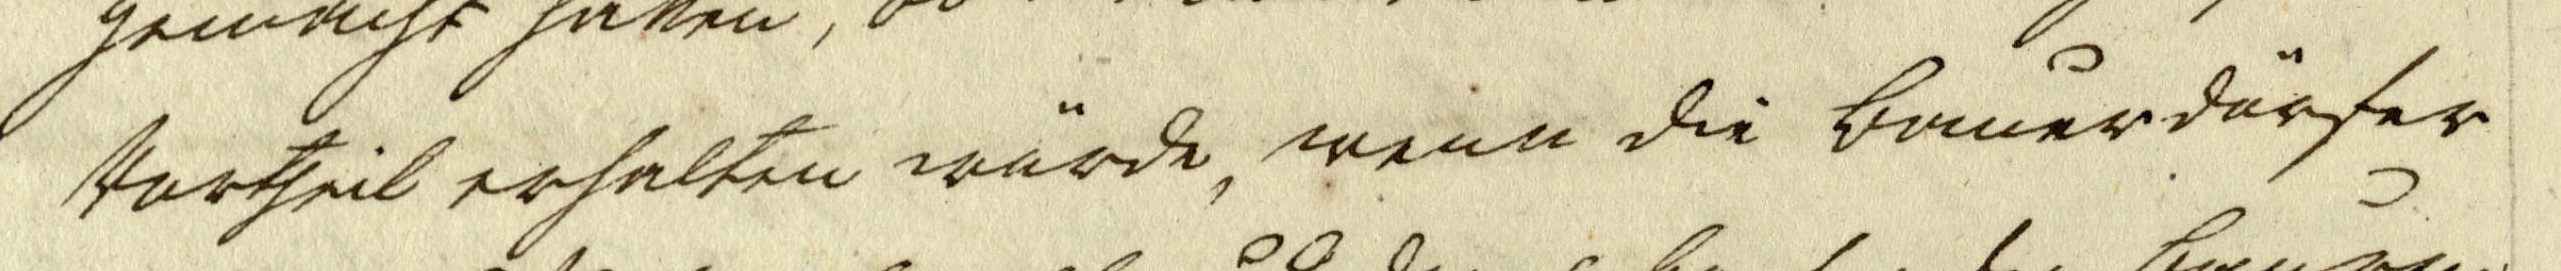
Vortheil erhalten würde, wenn die Bauerdörfer
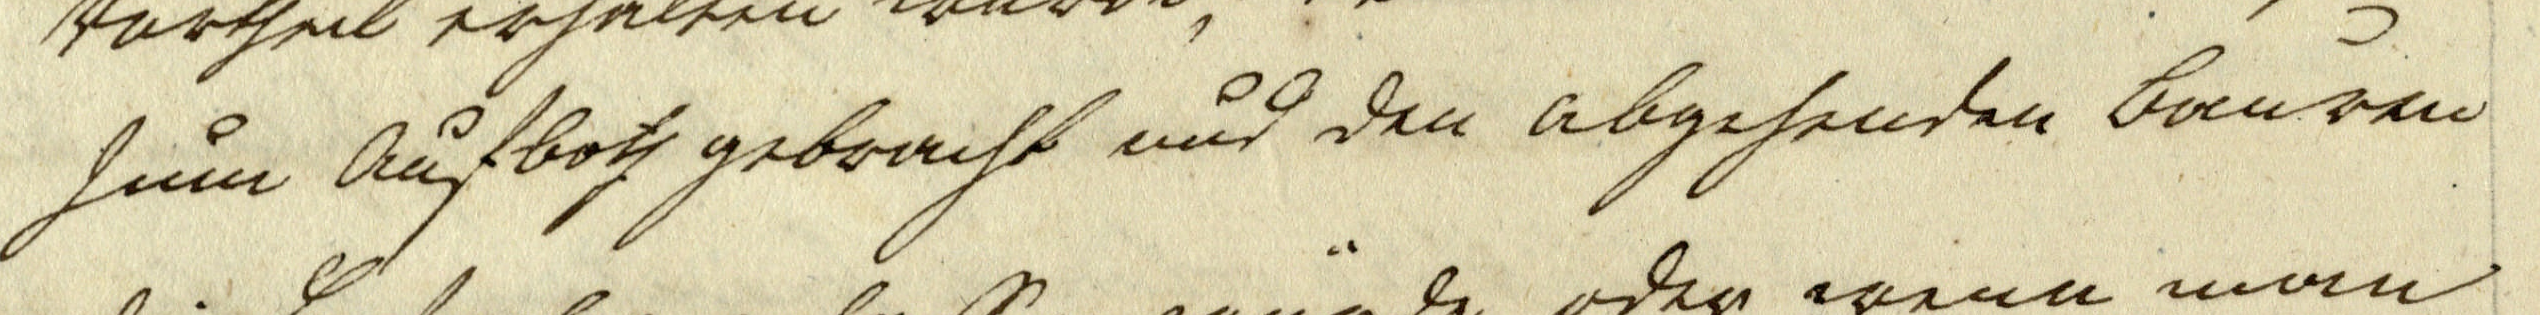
zum Aufboth gebracht und den abgehenden Bauren
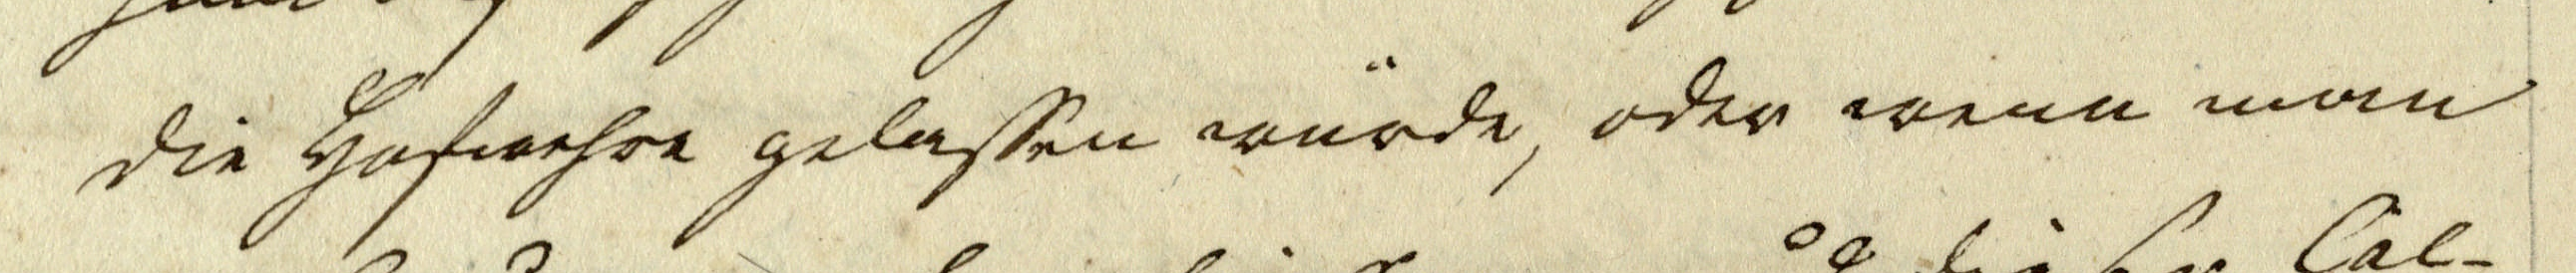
die Hofwehre gelassen würde, oder wenn man
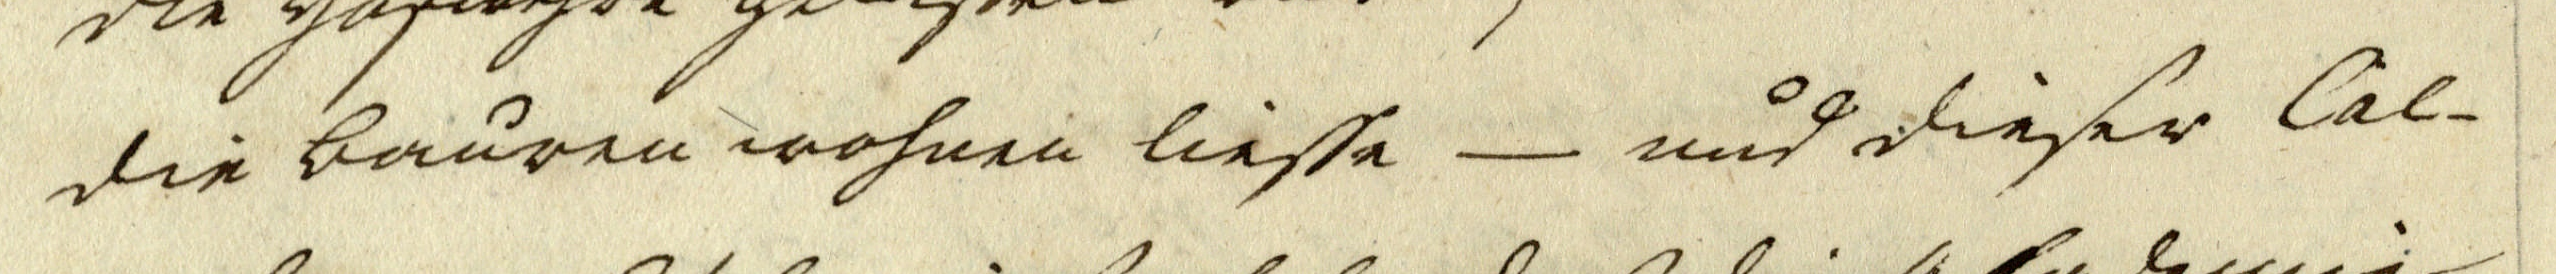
die Bauren wohnen liesse und dieser Cal¬
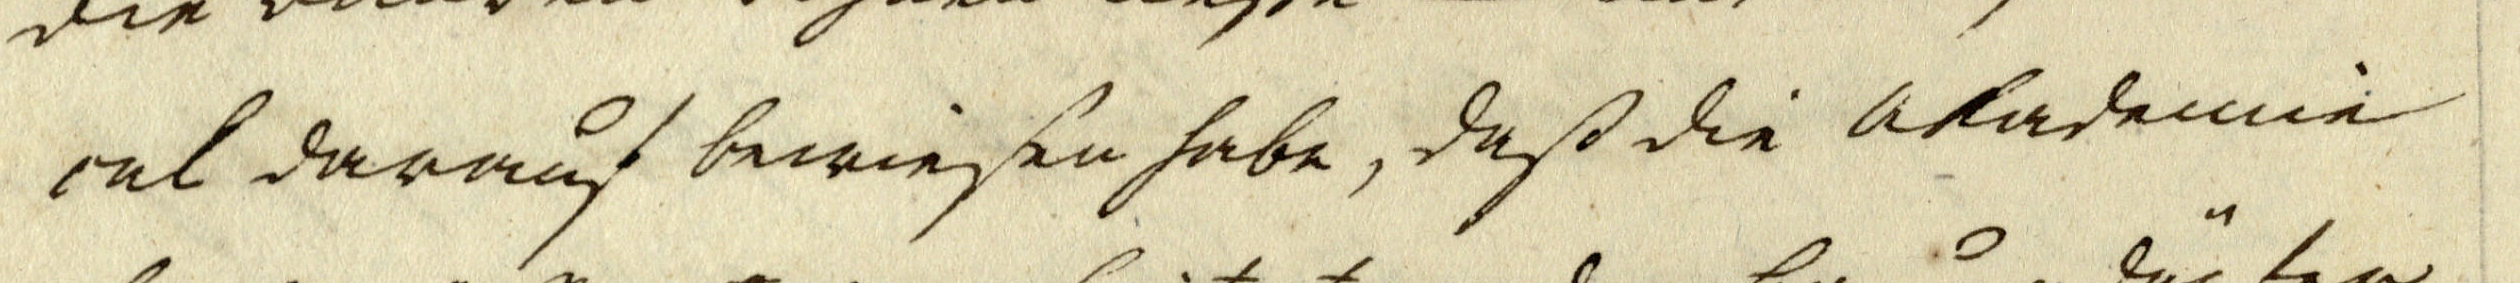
cul darauf bewiesen habe, daß die Akademie
